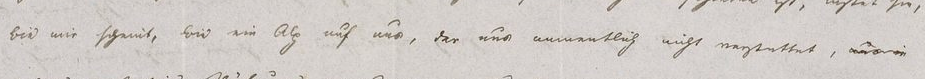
wie mir scheint, wie ein Alp auf uns, der uns namentlich nicht verstattet, uns in
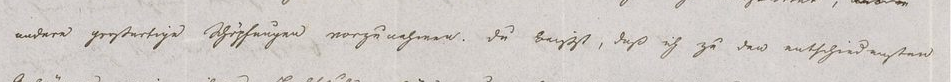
andere großartige Schöpfungen vorzunehmen. Du weißst, daß ich zu den entschiedensten
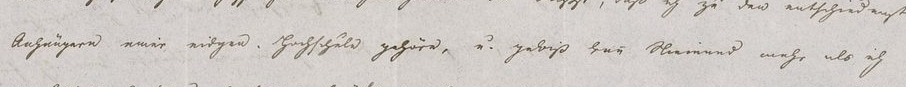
Anhängern einer eidgen. Hochschule gehöre, u. gewiß kann Niemand mehr als ich
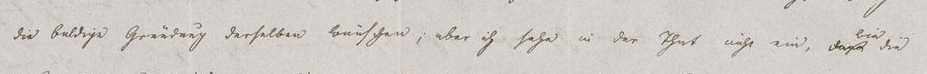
die baldige Gründung derselben wünschen, aber ich sehe in der That nicht ein, daßwie die
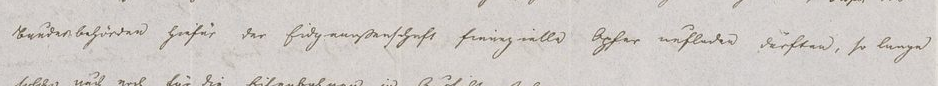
Bundesbehörden hiefür der Eidgenossenschaft finanzielle Opfer aufladen dürften, so lange
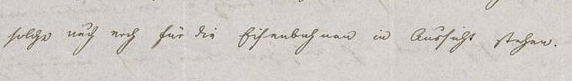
solche auch noch für die Eisenbahnen in Aussicht stehen.
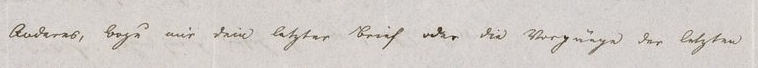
Anderes, wozu mir Dein letzter Brief oder die Vorgänge der letzten
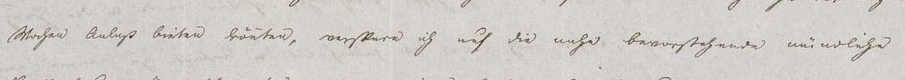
Wochen Anlaß bieten könnten, verspare ich auf die nahe bevorstehende mündliche
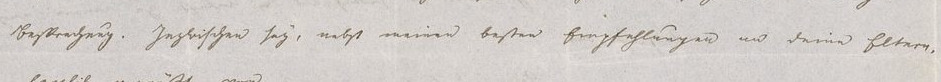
Besprechung. Inzwischen sey, nebst meinen besten Empfehlungen an Deine Eltern.
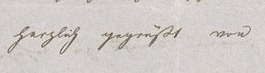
herzlich gegrüßt von
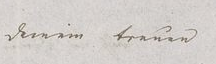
Deinem treuen
